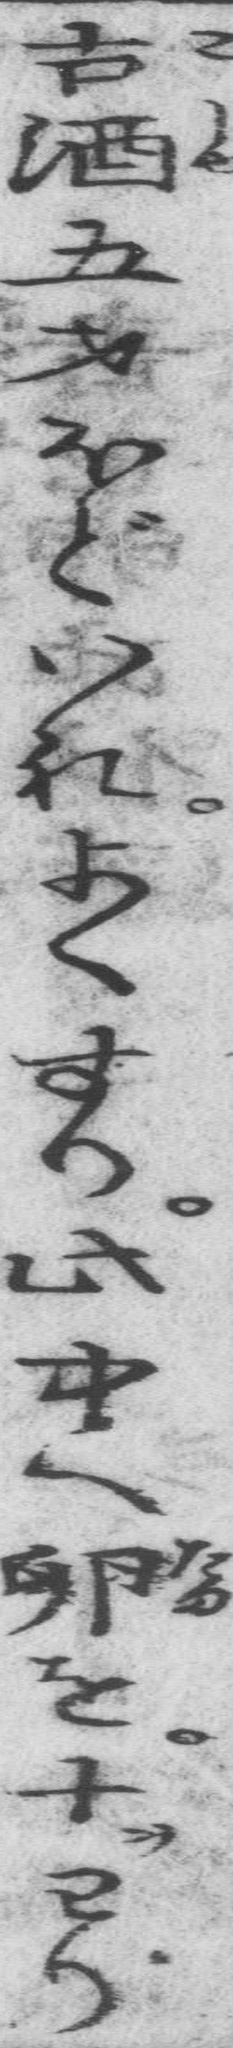古酒五才ほどいれ。よくすり。此中へ卵を。十ヲわり
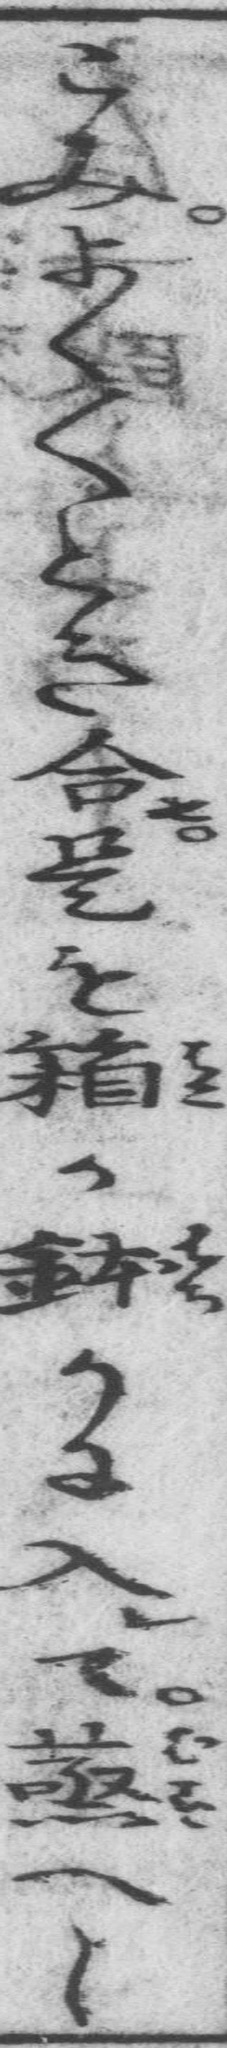こみ。よく〳〵とき合せ。是も箱か鉢かに入れて。蒸へし
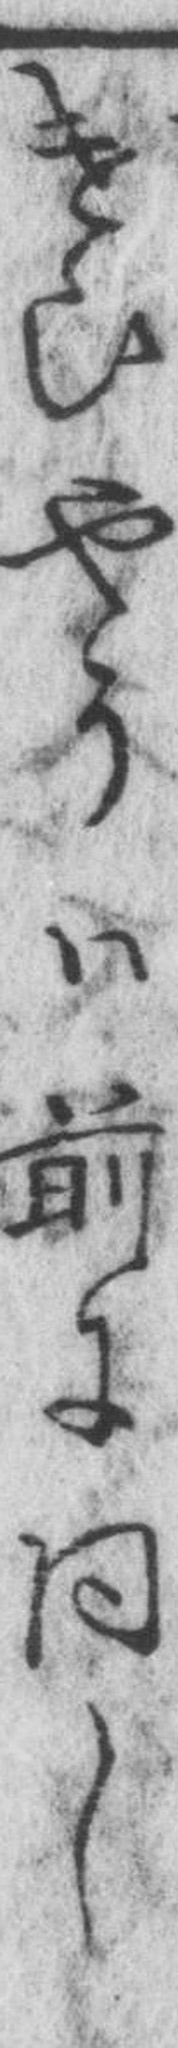遣ひやうは。前に同し
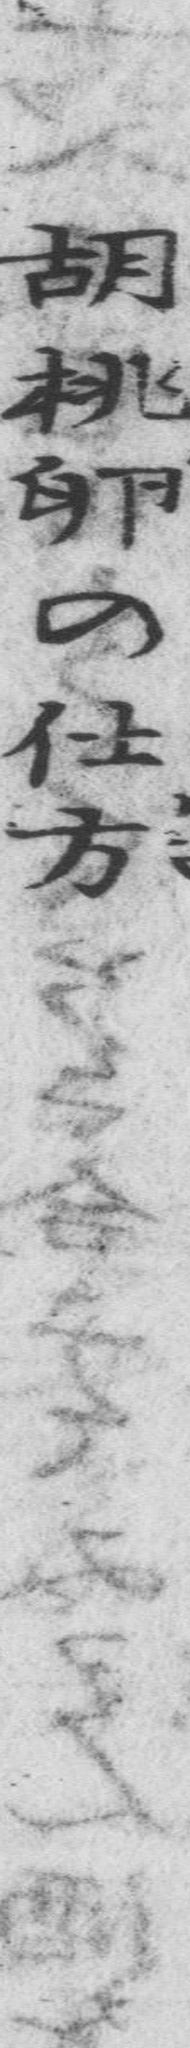胡桃卵の仕方
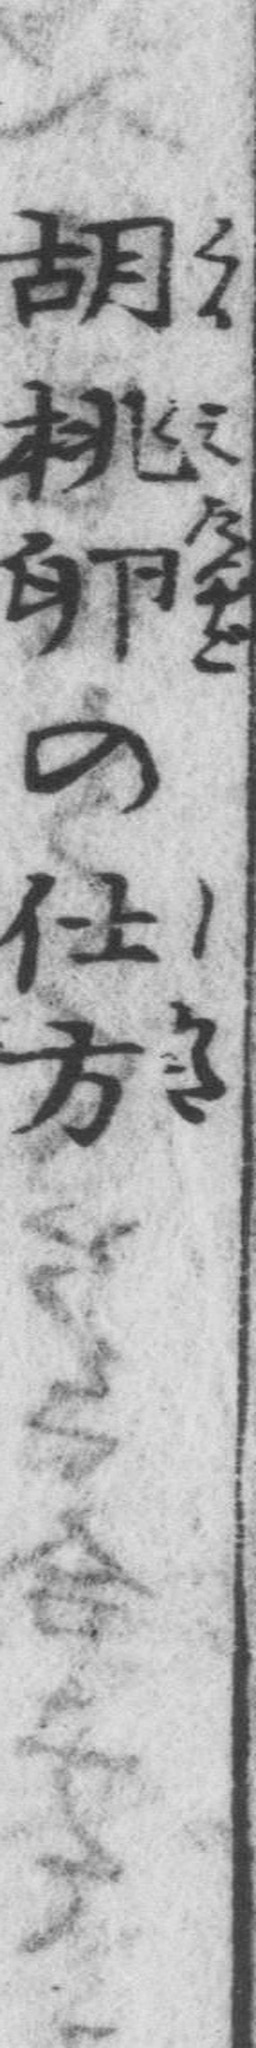胡桃卵の仕方
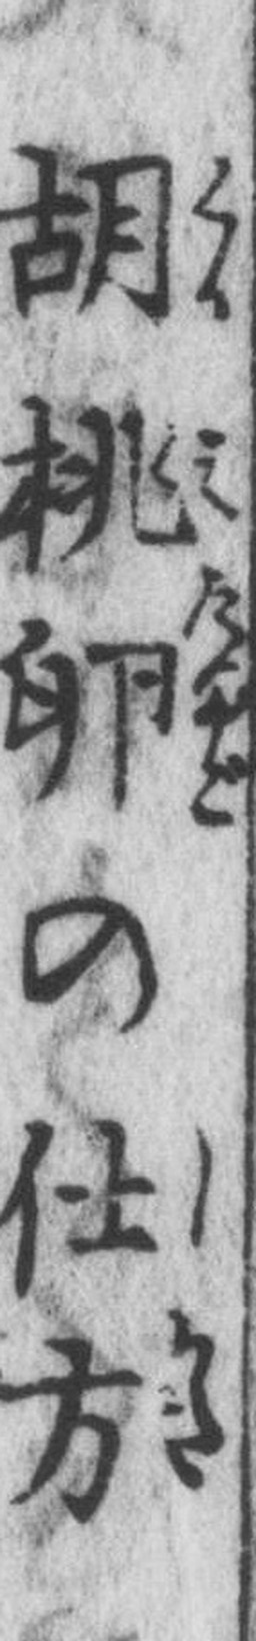胡桃卵の仕方
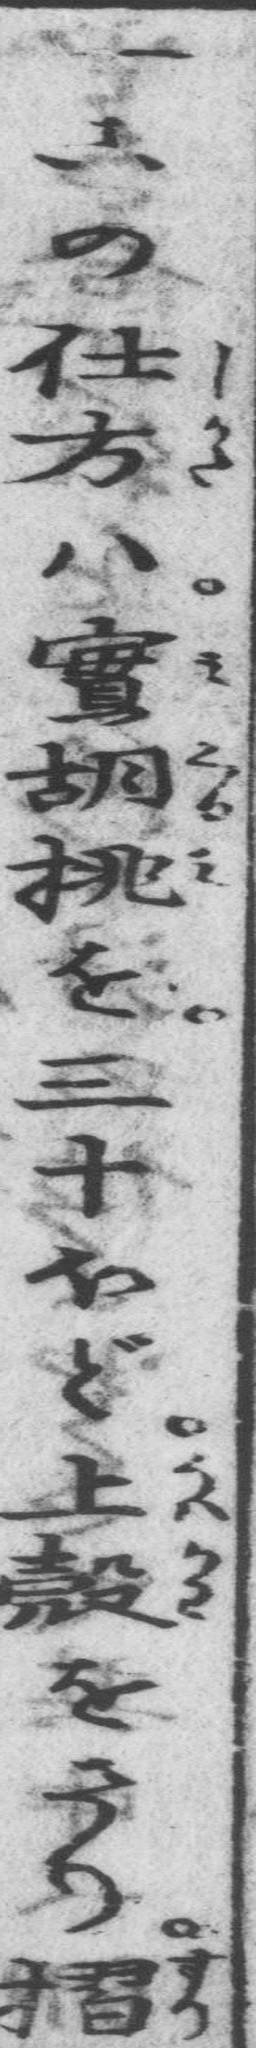一この仕方は。実胡桃を。三十ほど、上殻をさり。摺
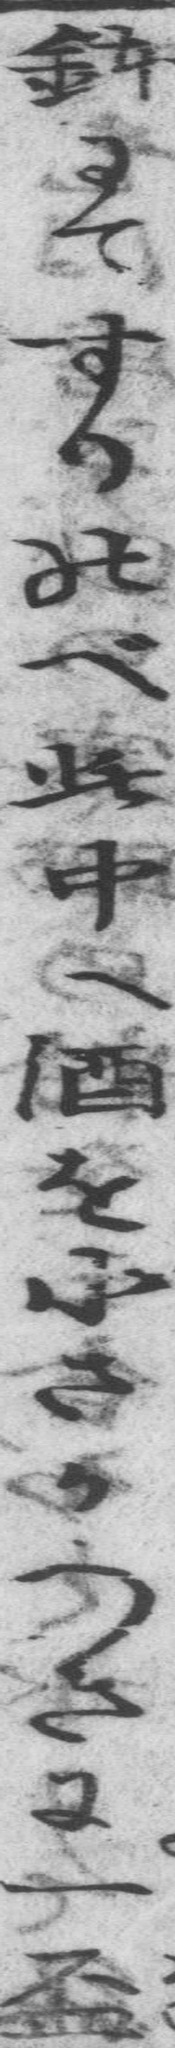鉢にてすりのべ。此中へ酒を。小さかつきに。一盃
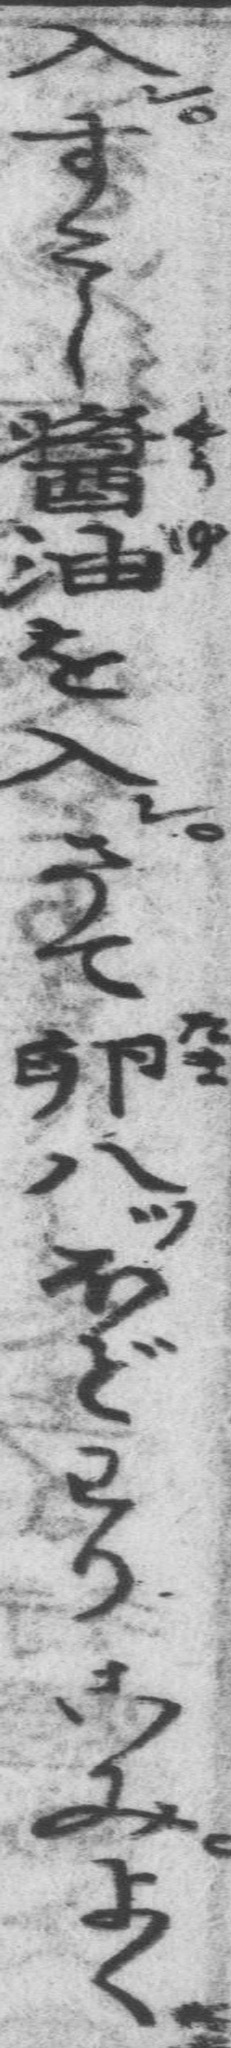入れ。すこし醤油を入れ。さて卵八ツほどわりこみ。よく
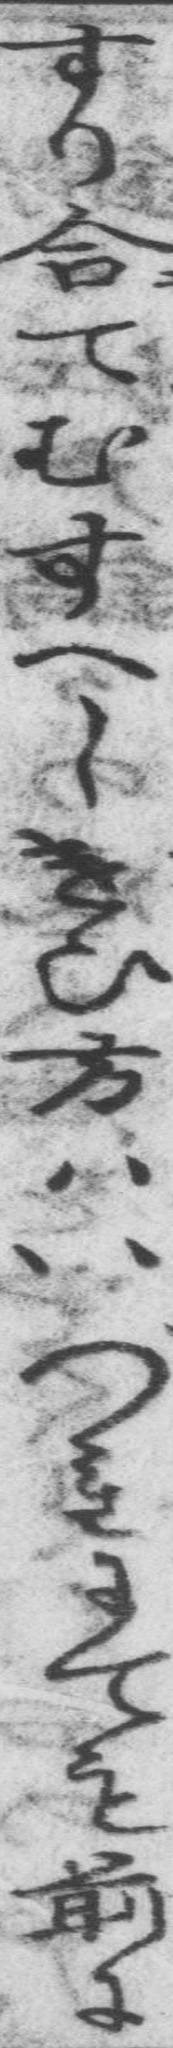すり合せて。むすへし遣ひ方は。いづれにても。前に
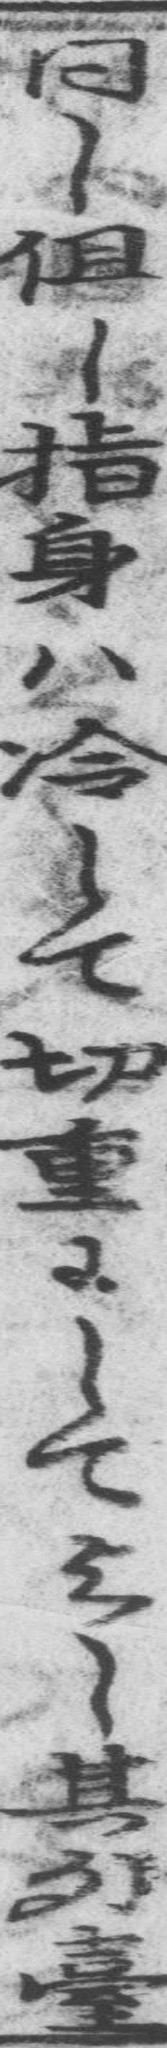同し。但し指身は。冷して切重にしてよし。其外台
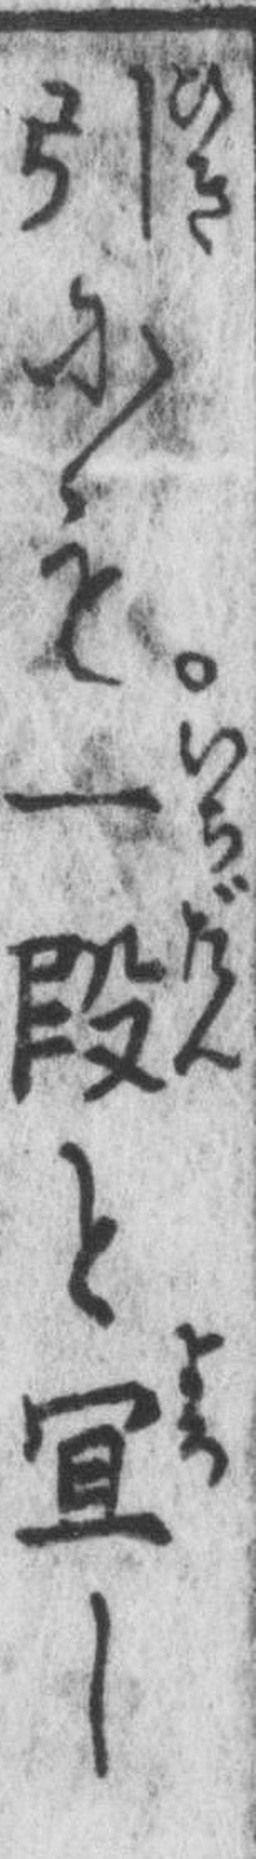引にも。一段と宜し
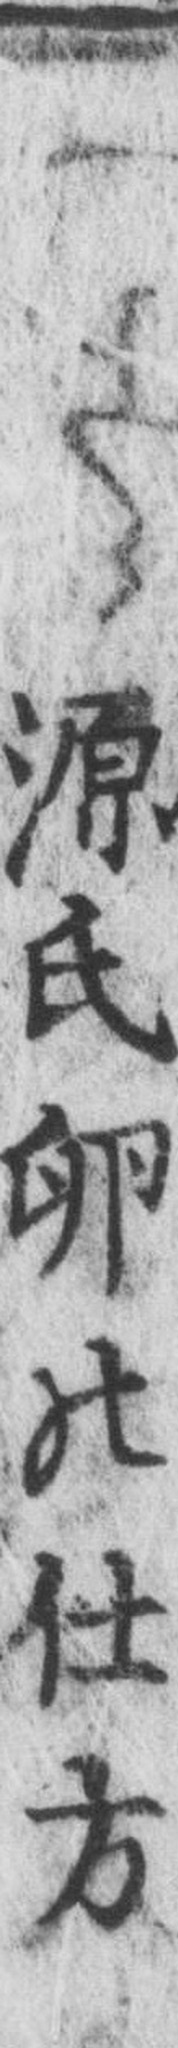源氏卵の仕方
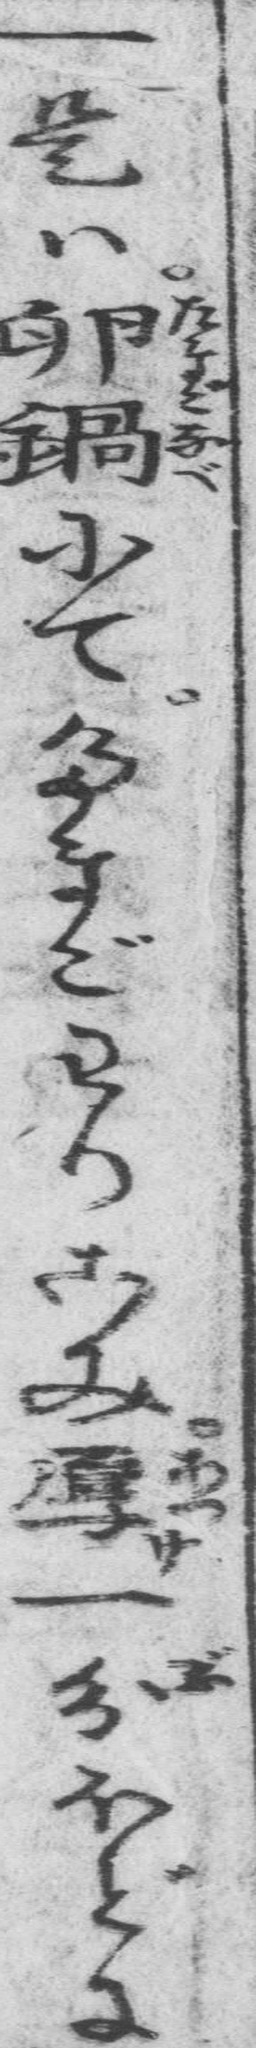一是は。卵鍋にて。たまごわりこみ。厚さ一分ほどに
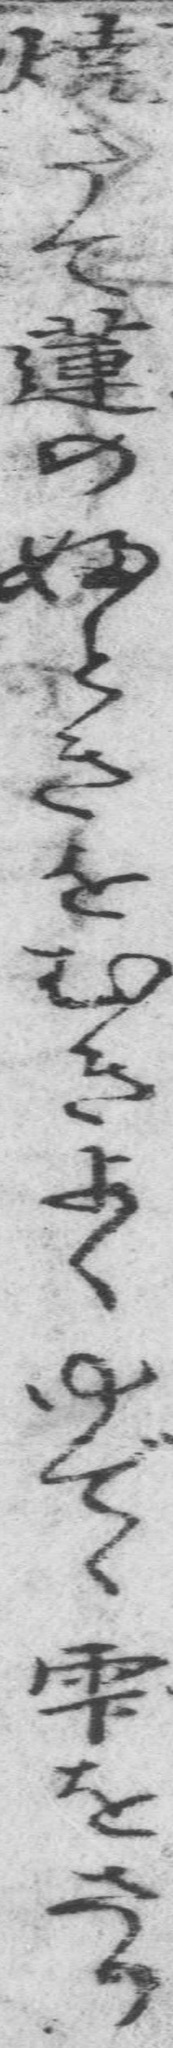焼。さて蓮のふときを。むきよくゆでゝ雫をさり。
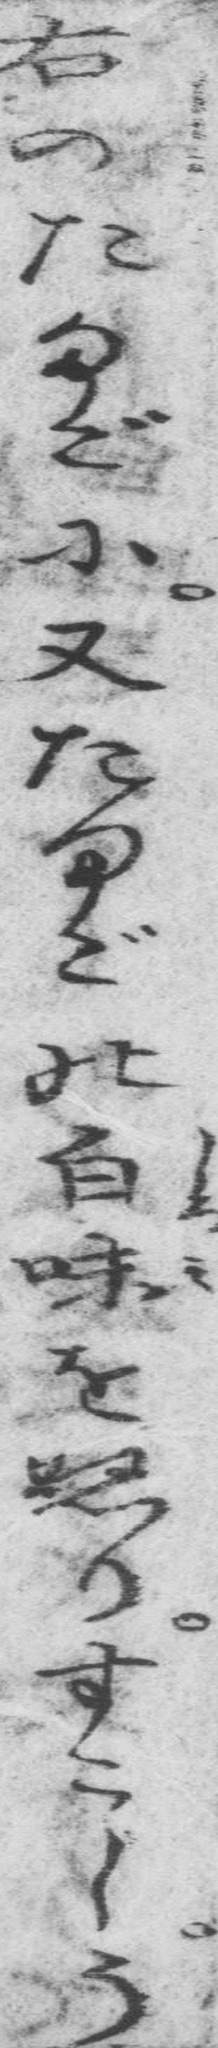右のたまごに。又たまごの白味をぬり。すこし。う
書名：萬寳料理秘密箱
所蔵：大阪府立大学学術情報センター 国文学研究資料館
